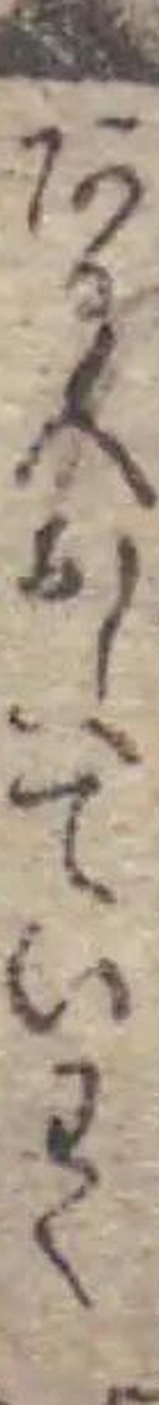ある人おしへていわく
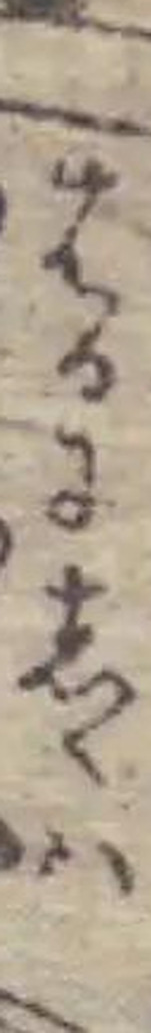はるにしくは
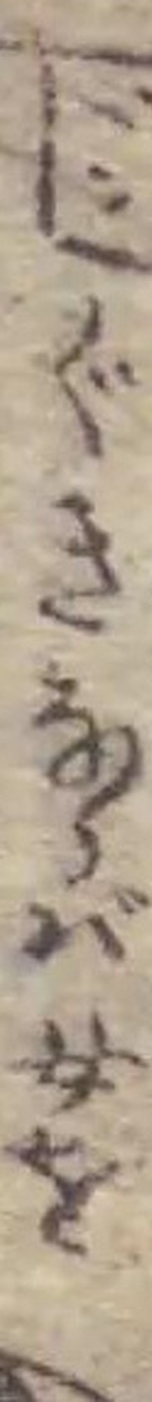ぐきならば女を
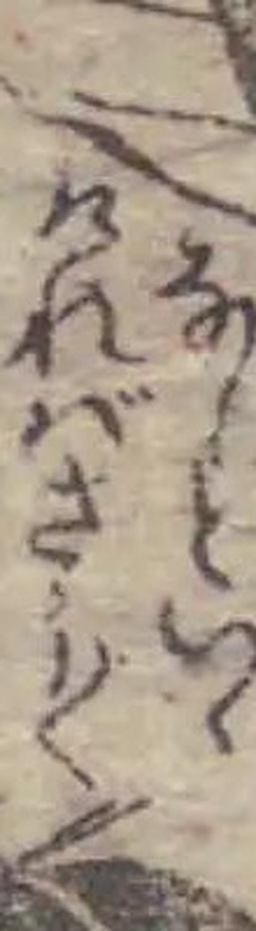ければさう〳〵
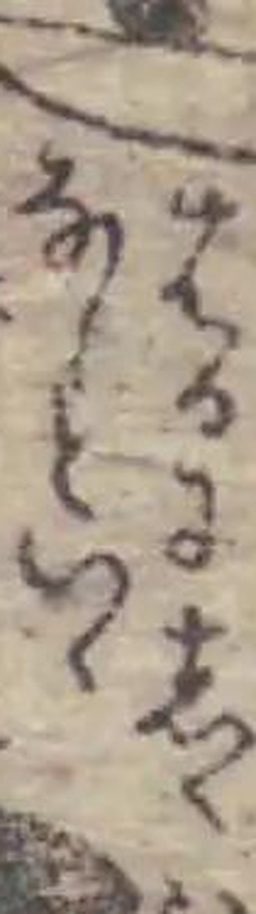なしといゝ
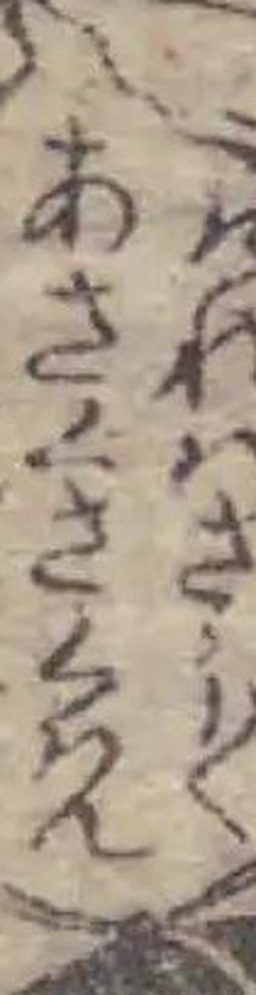あさくさくはん
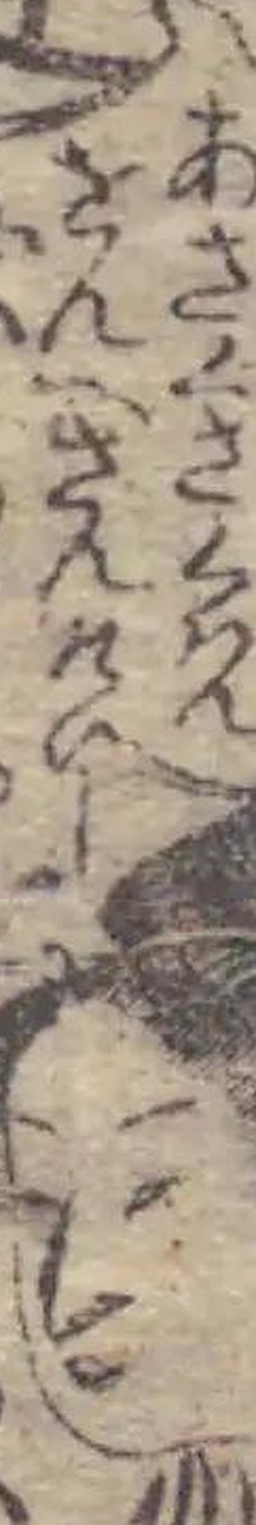をんへさんけいし
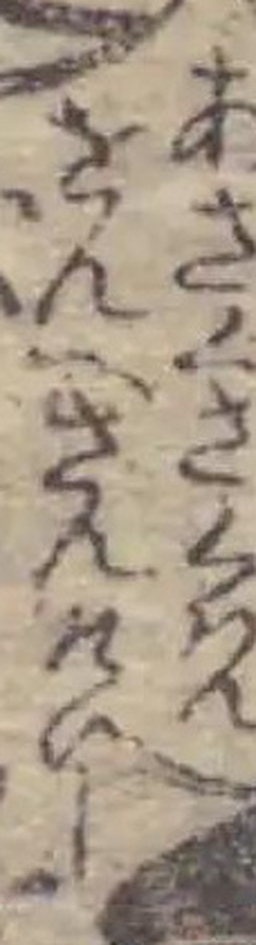をんへさんけいし
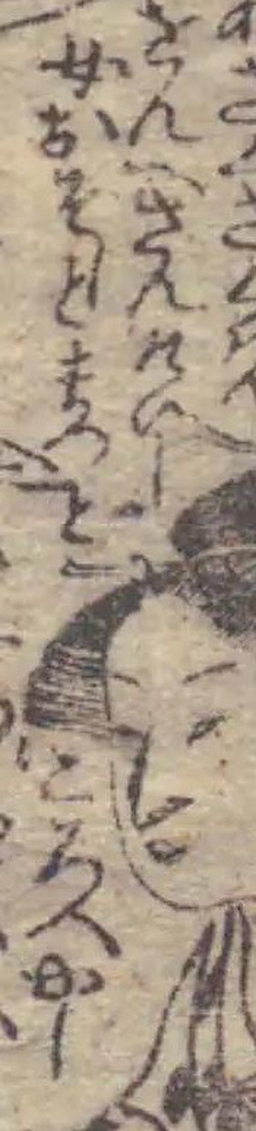女おそしとまつところへやし
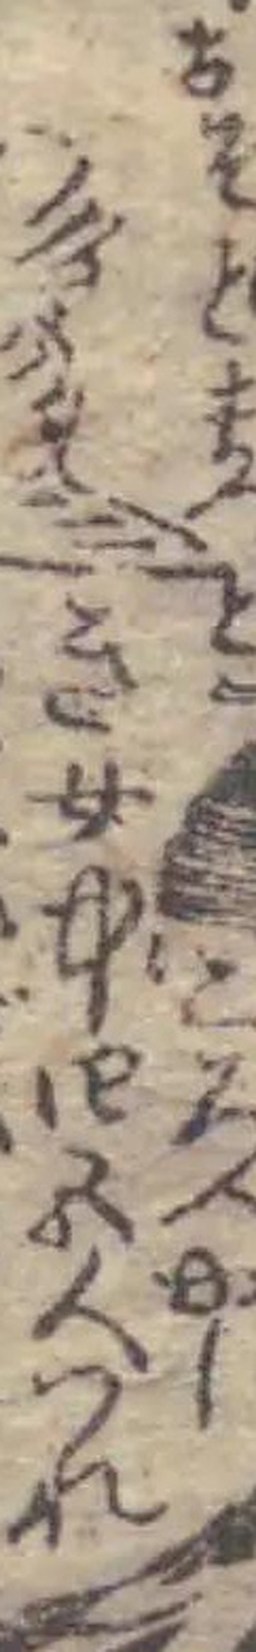き女中四五人つれ
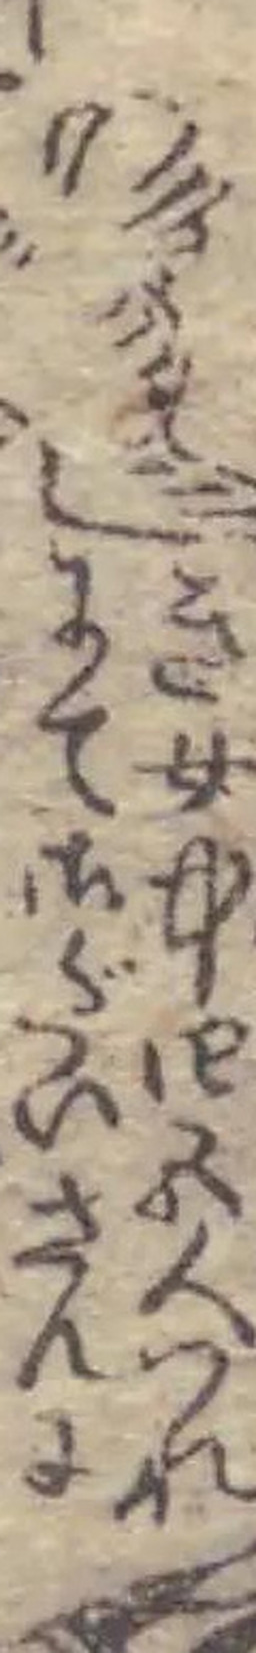にて御だいさんに
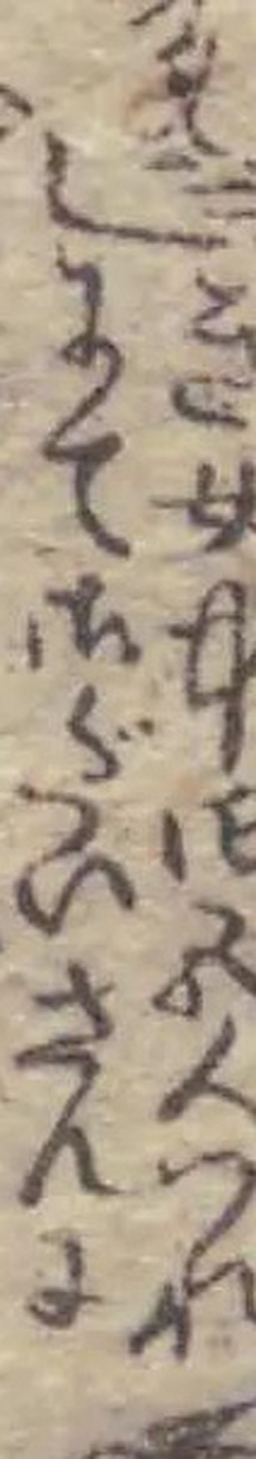にて御だいさんに
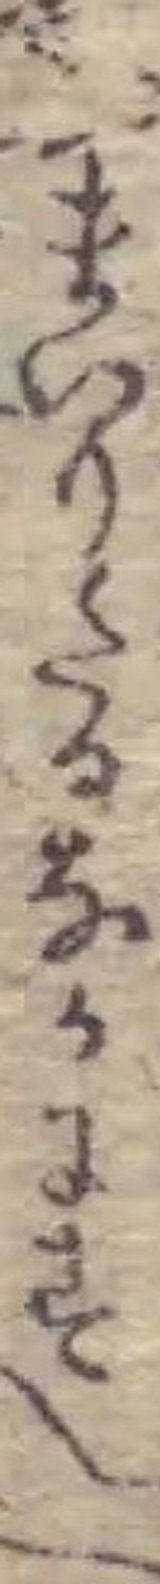まいりたるなかにす
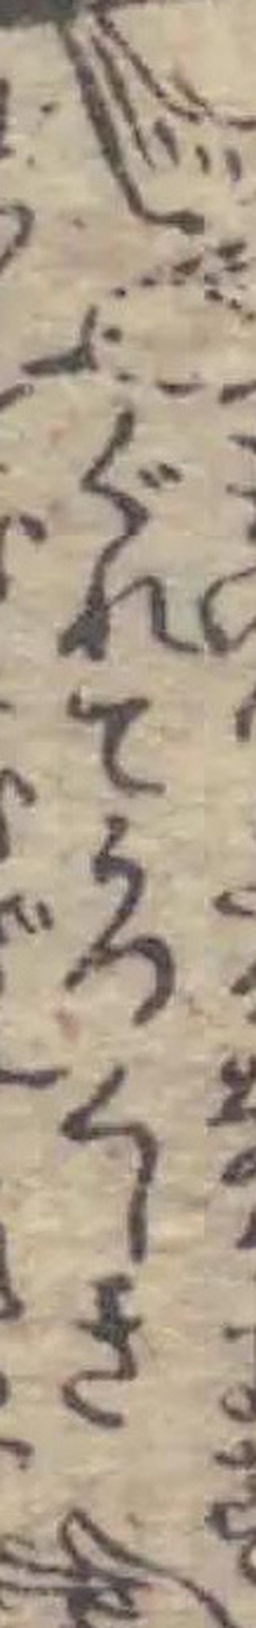ぐれてうつくしき
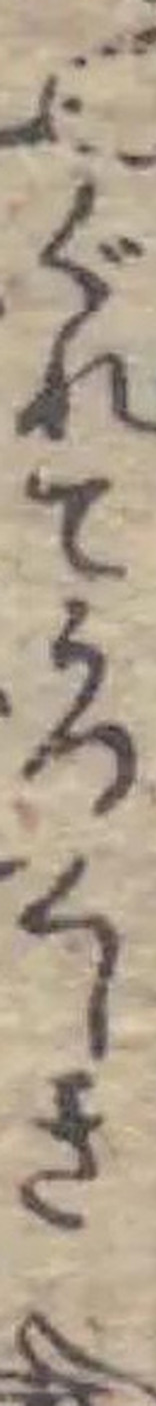ぐれてうつくしき
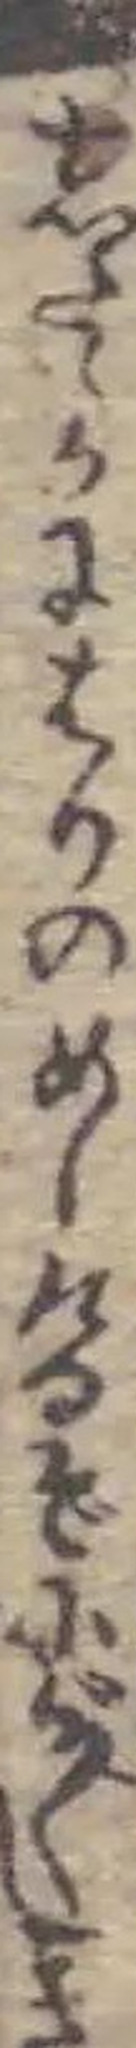したゝかにはりのめしけるぞにが〳〵しき
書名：色男其処此処 3巻
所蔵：国立国会図書館 National Diet Library, JAPAN
